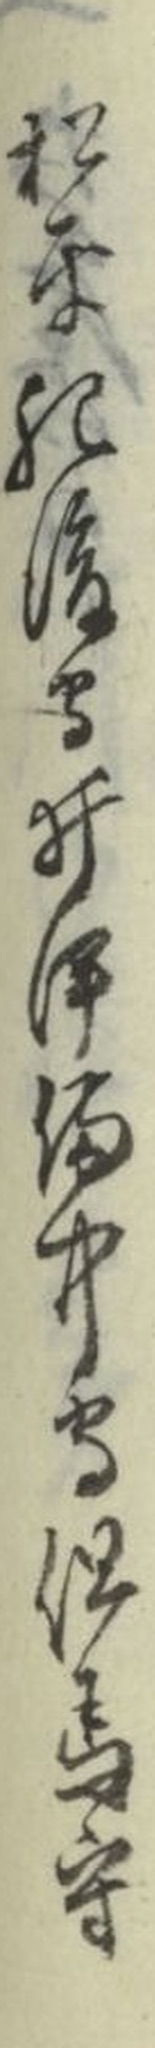松平肥後守井伊備中守但馬守
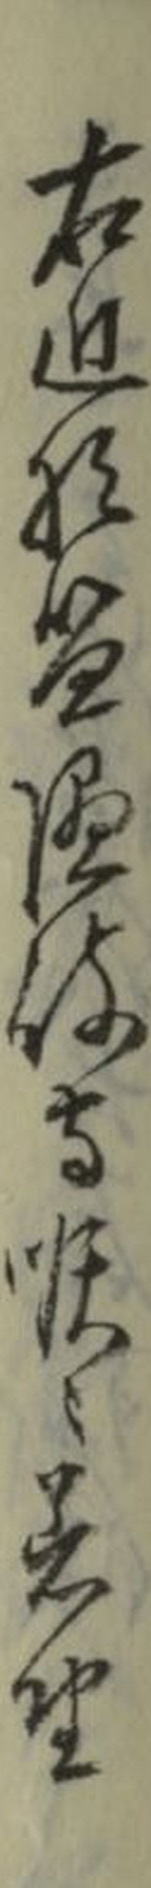右近将監隠岐守順々着坐
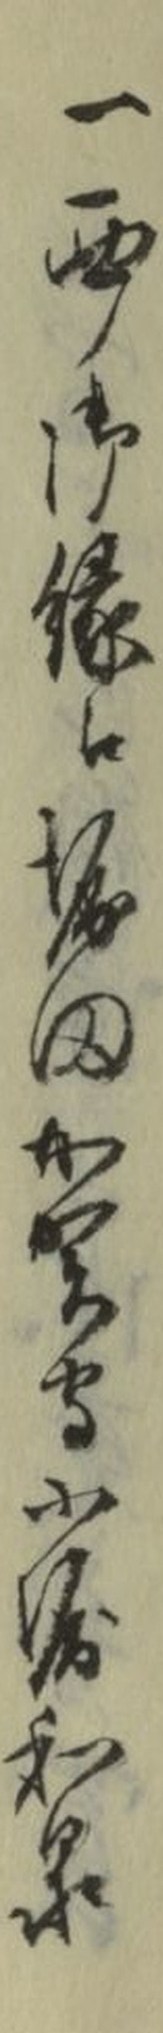一西の御縁え堀田加賀守小堀和泉
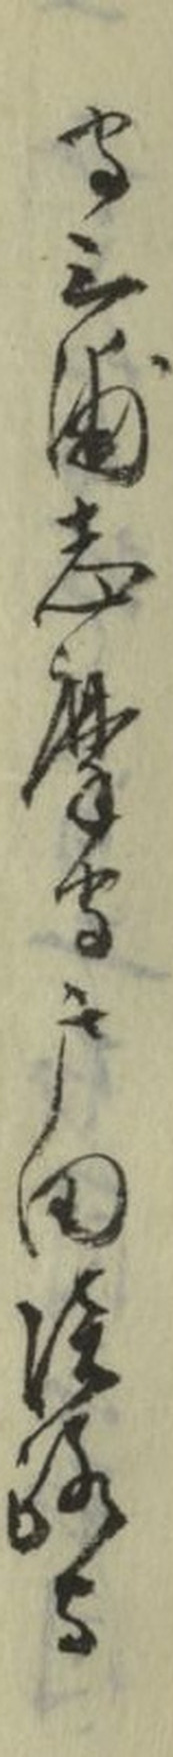守三浦志摩守戸田淡路守
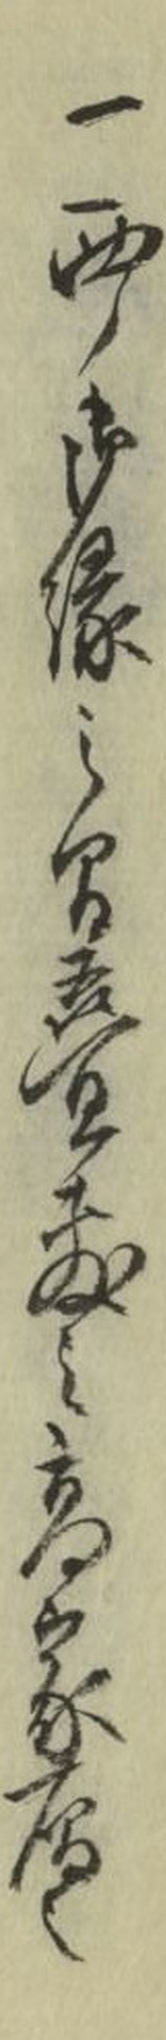一西の縁之間畳敷之高家雁之
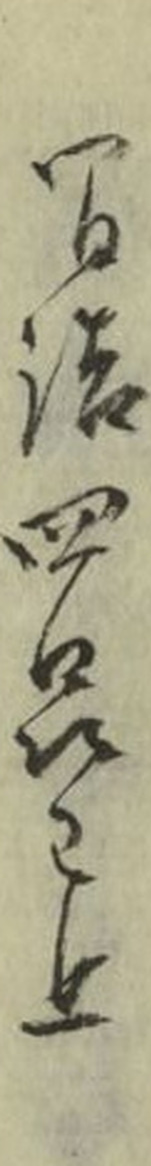間詰四品已上
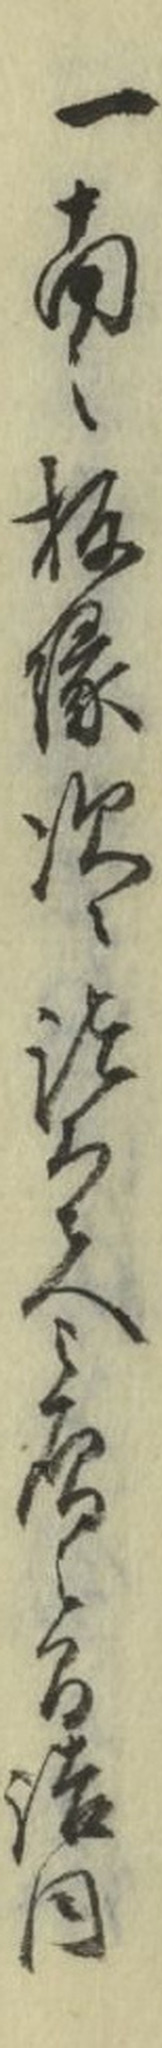一南之板縁次に諸大夫之雁之間詰同

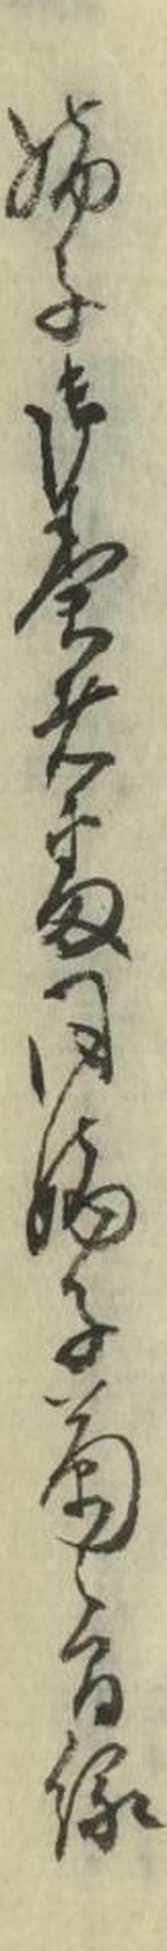嫡子御奏者番同嫡子菊之間縁
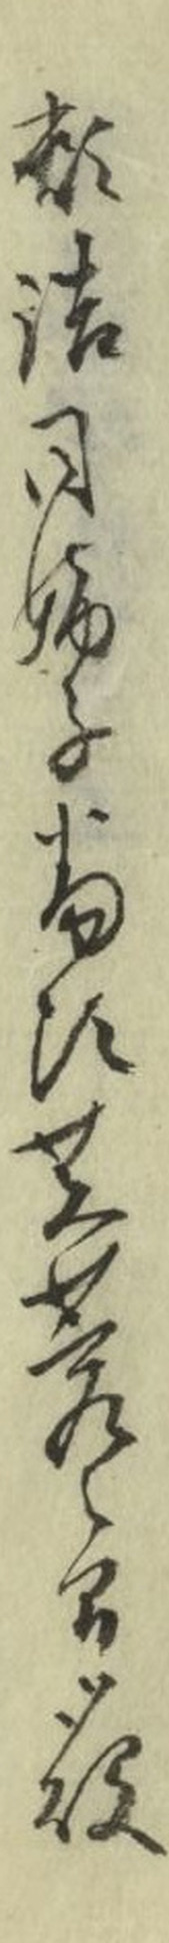頬詰同嫡子番頭芙蓉之間御役
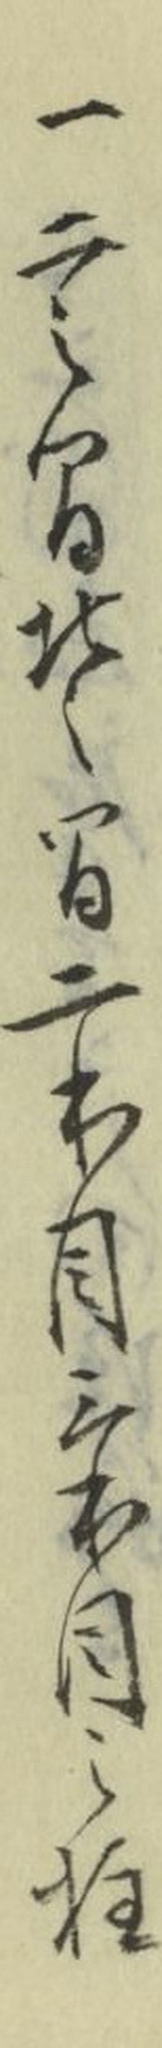一二之間北之間二本目三本目之柱
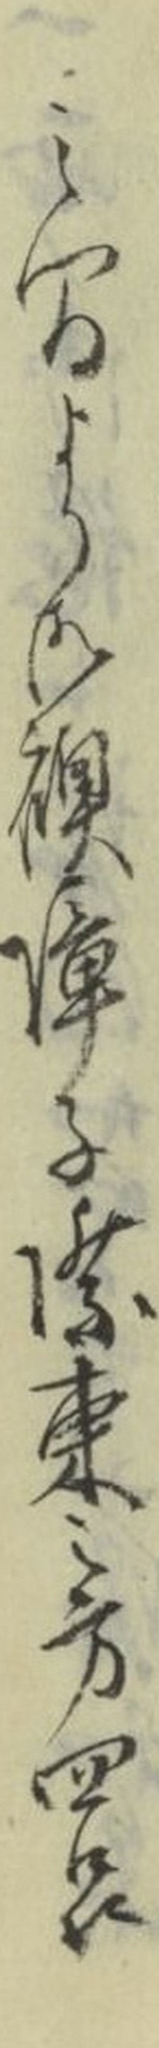之間より御襖障子際東之方四品
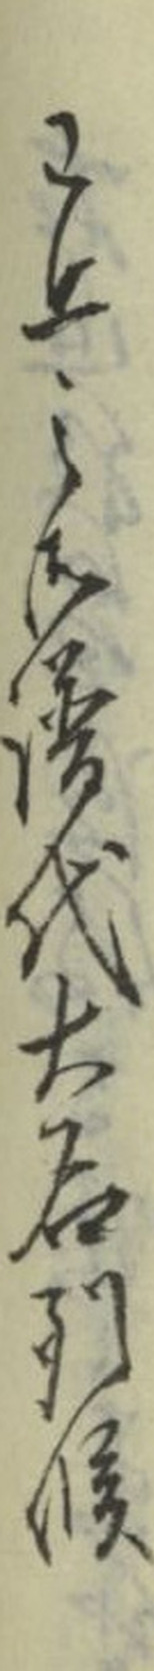已上之御譜代大名列候
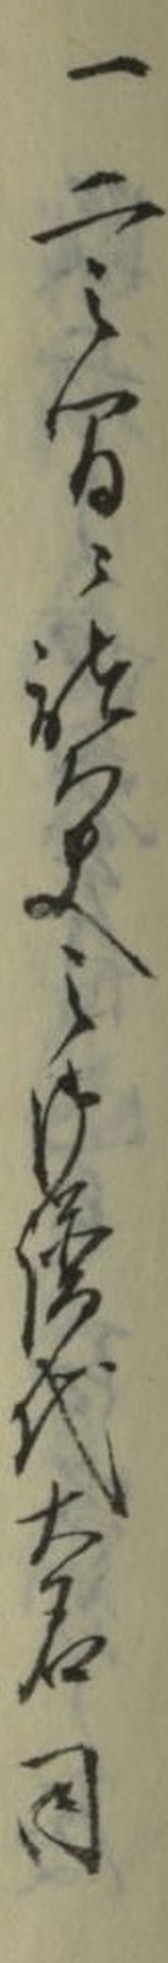一二之間に諸大夫之御譜代大名同
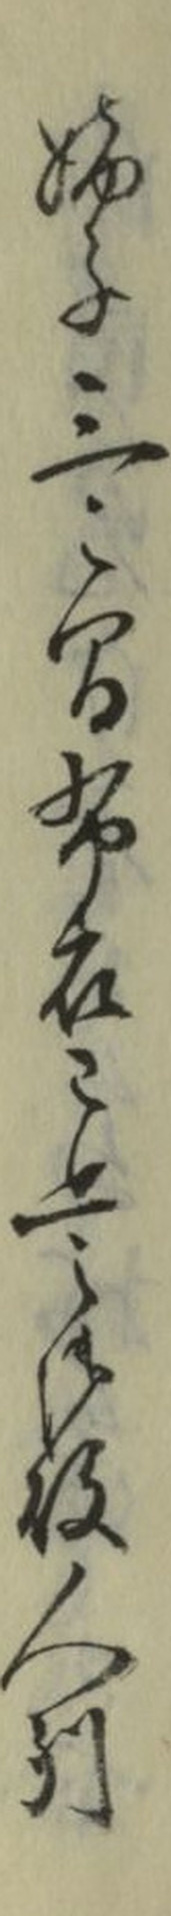嫡子三之間布衣已上之御役人列
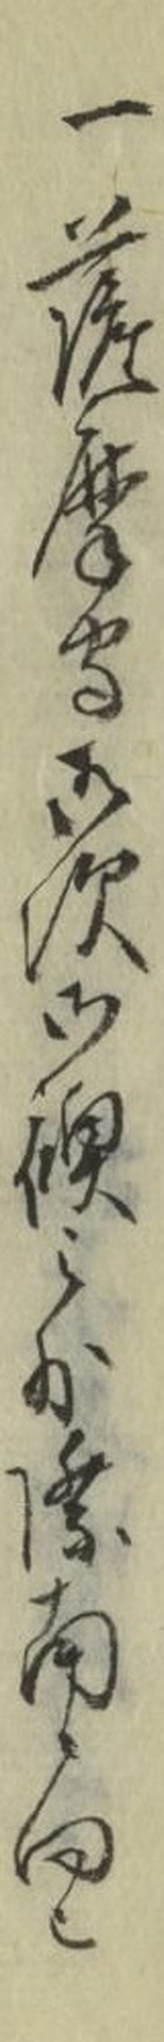一薩摩守御次御襖之外際南に向而
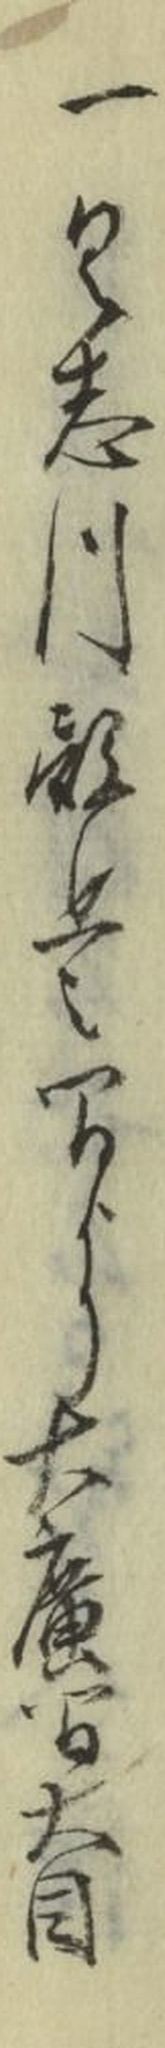一具志川殿上之間より大広間大目
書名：琉球人来朝記 三
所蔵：University of the Ryukyus Library
